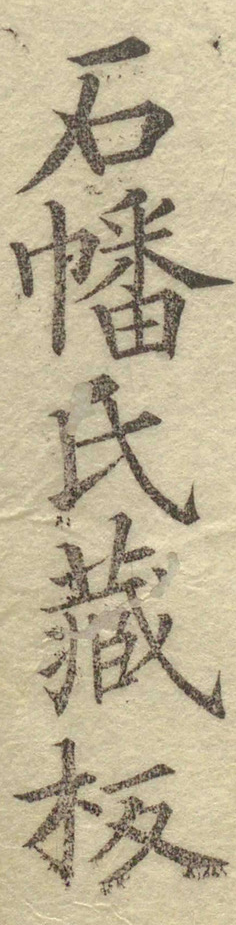石幡氏蔵板
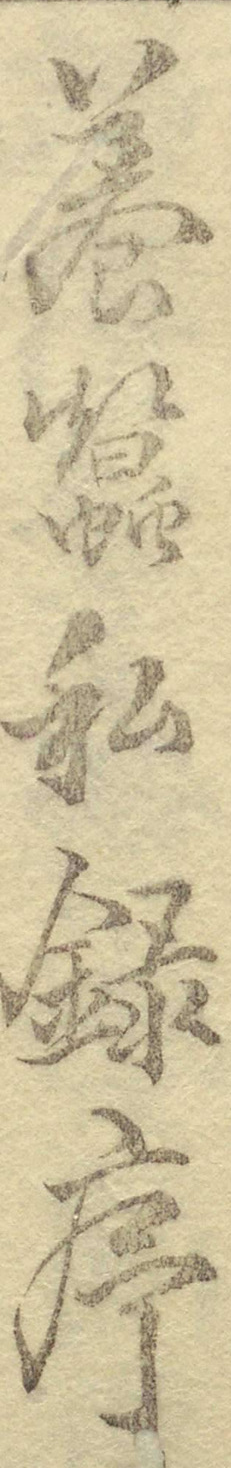養蚕私録序
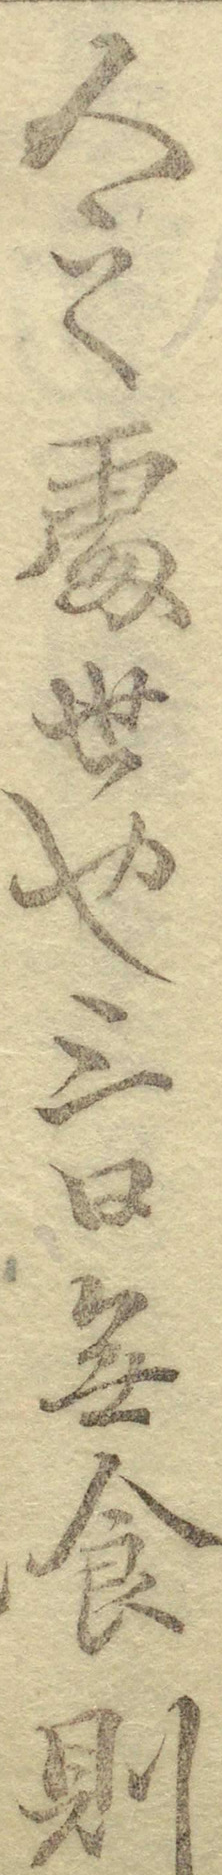人之処世也三日無食則
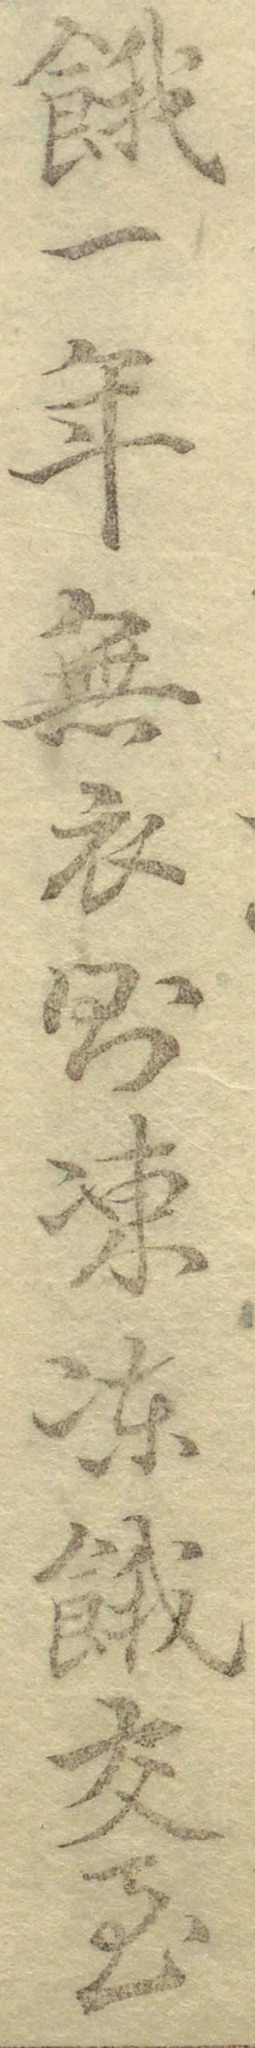餓一年無衣則凍凍餓交至
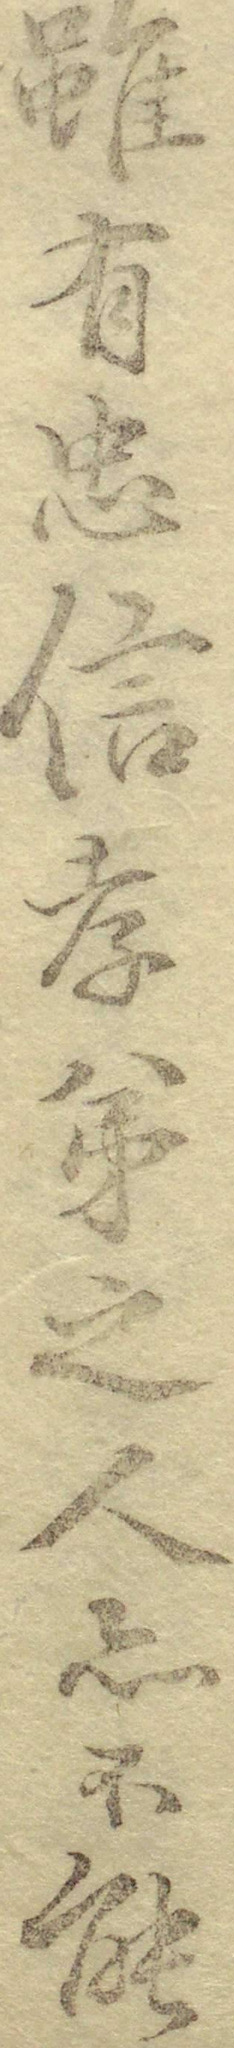雖有忠信孝弟之人志不能
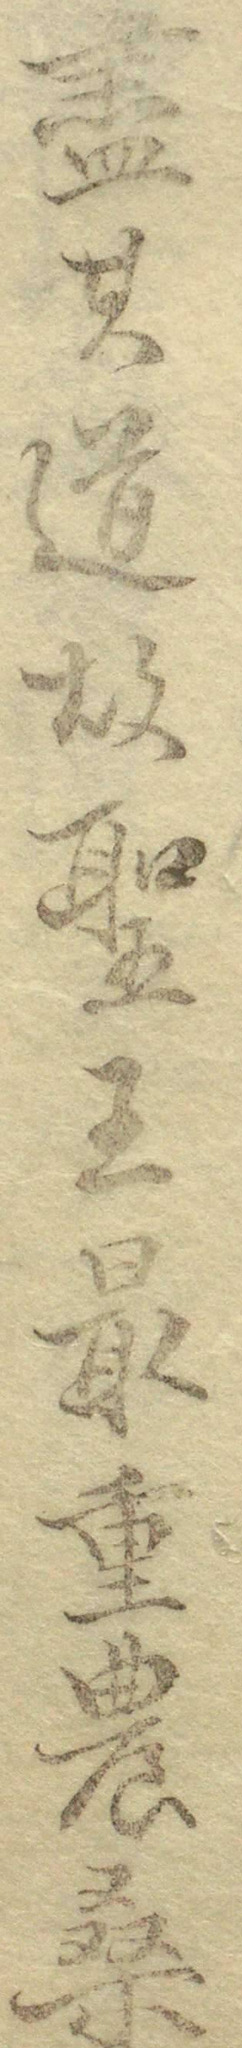尽其道故聖王最重農桑
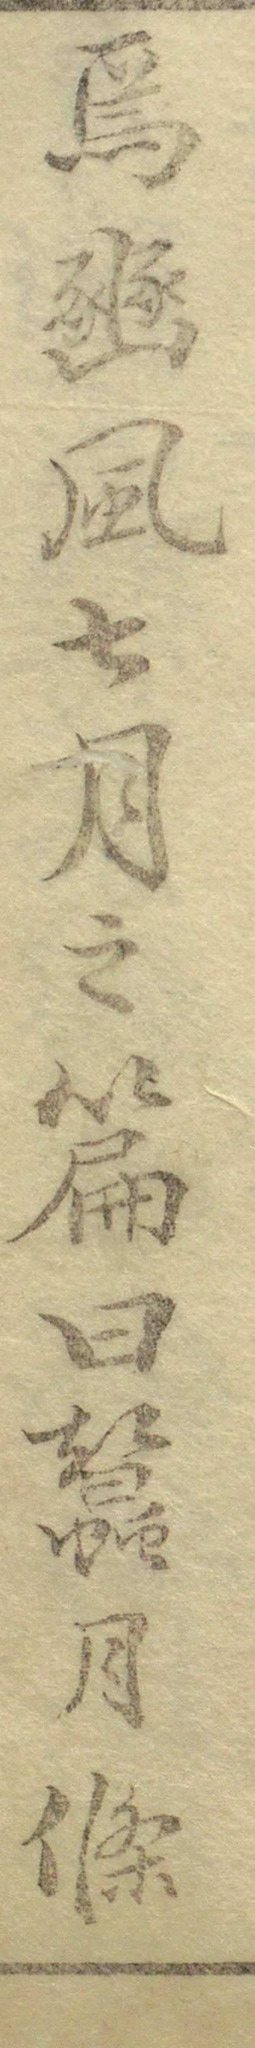焉豳風七月之篇曰蚕月條
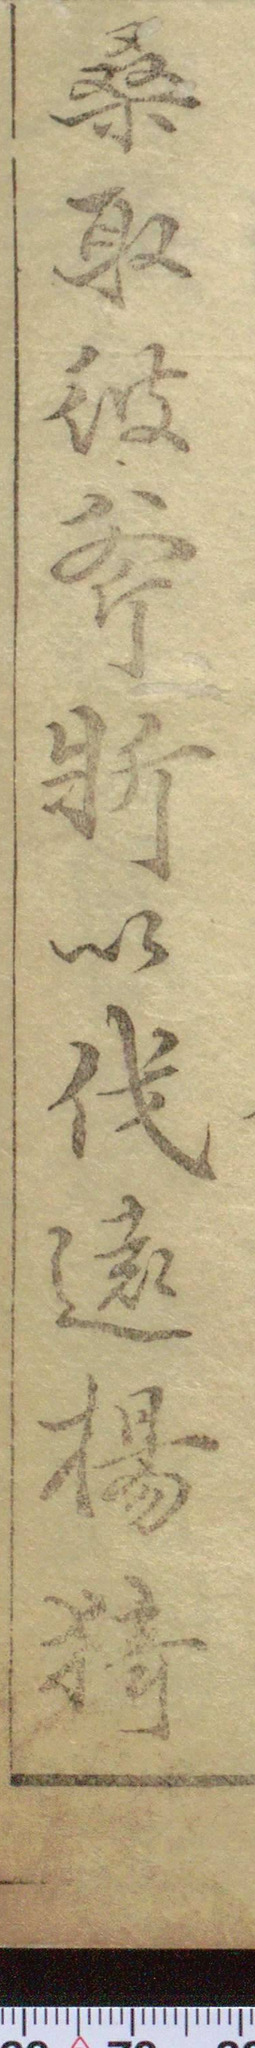桑取彼斧斨以伐遠揚猗

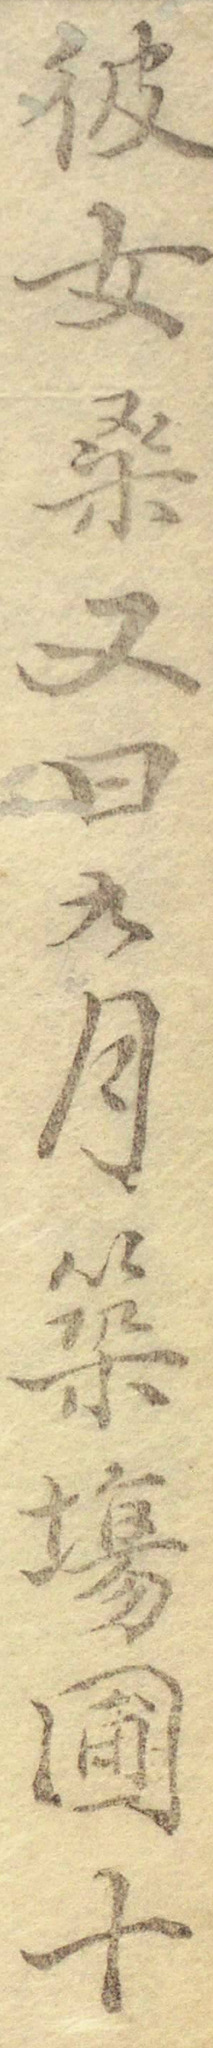彼女桑又曰九月築場圃十
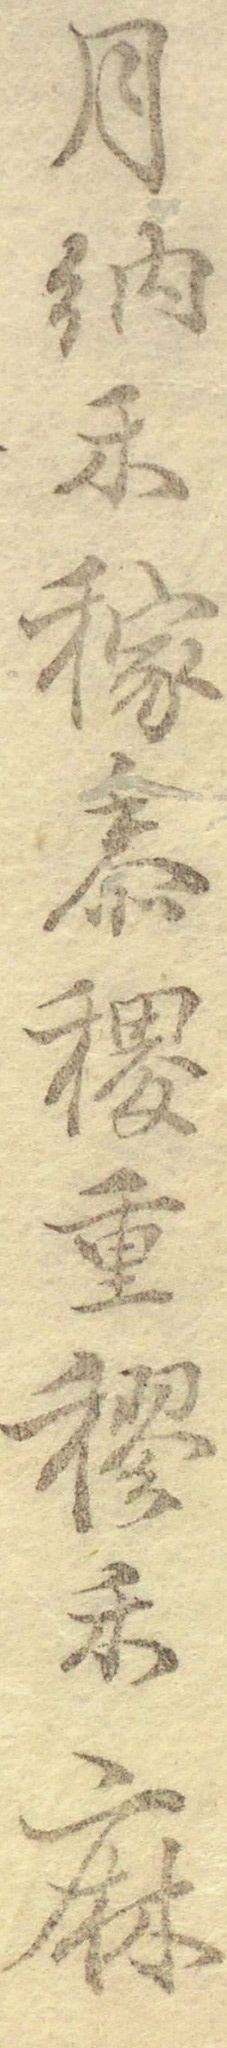月納禾稼黍稷重穋禾麻
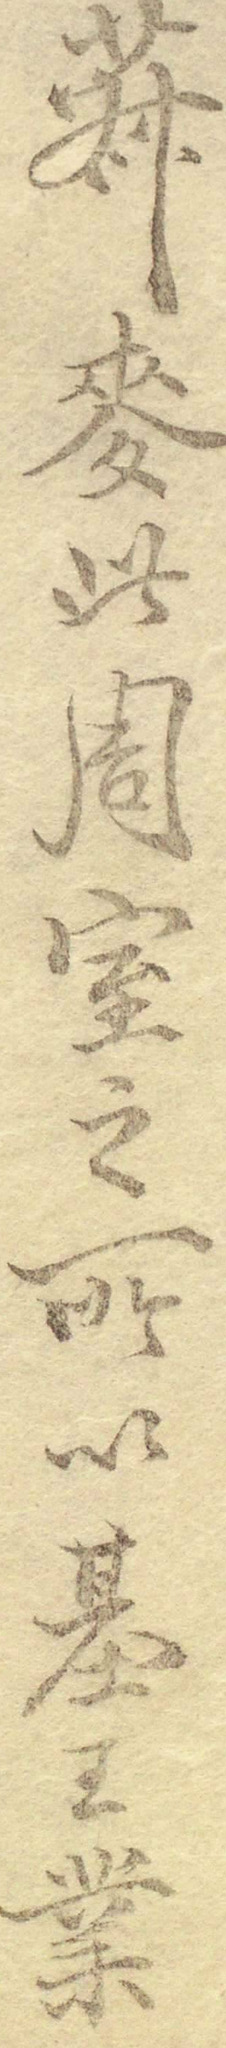菽麦此周室之所以基王業
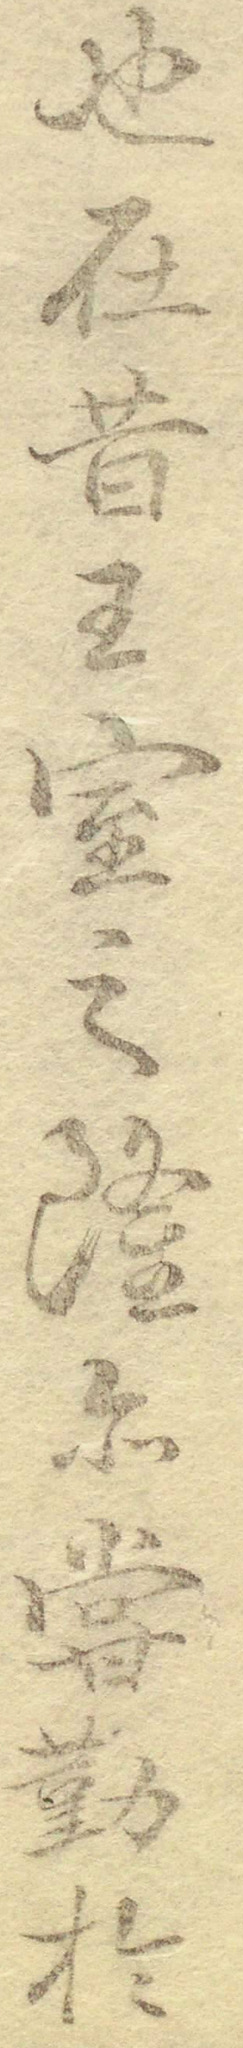也在昔王室之隆亦嘗勤於
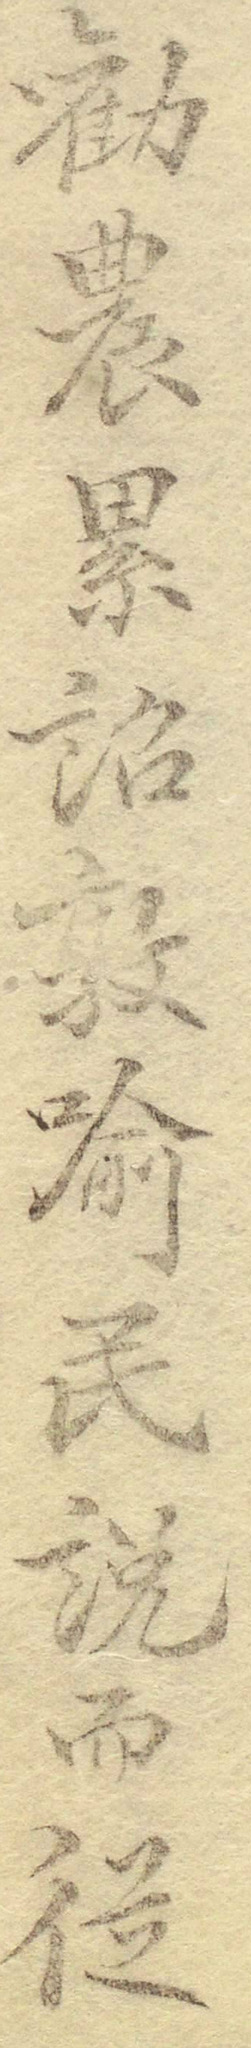勧農累詔敦喩民説而従
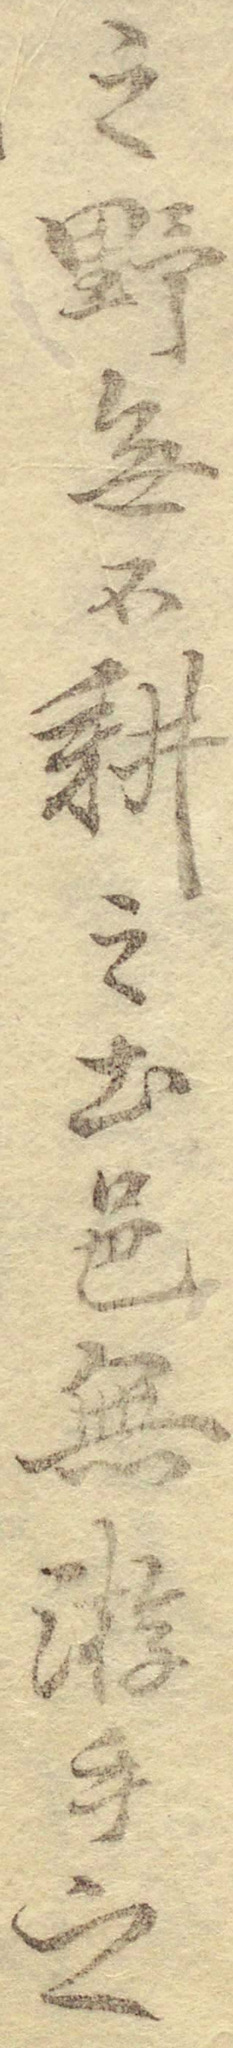之野無不耕之土邑無游手之
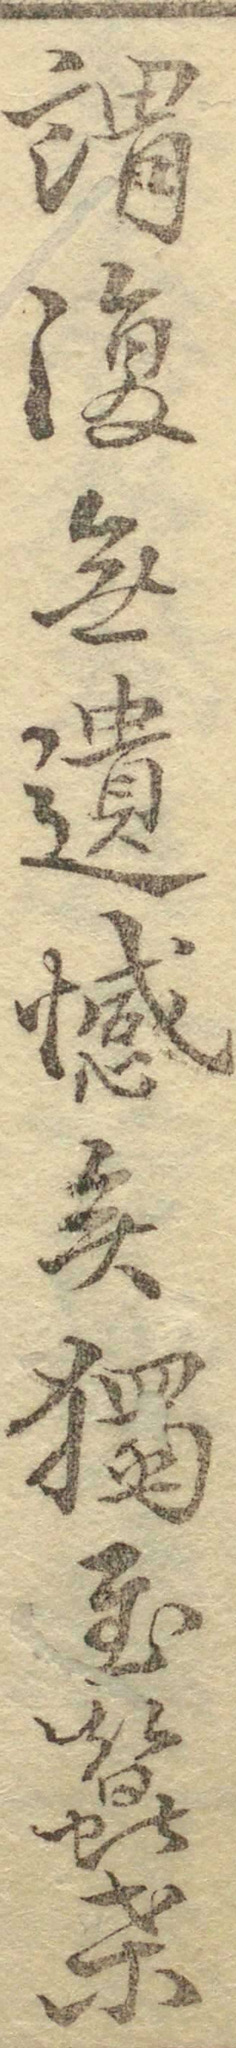謂復無遺憾矣独至蚕桑
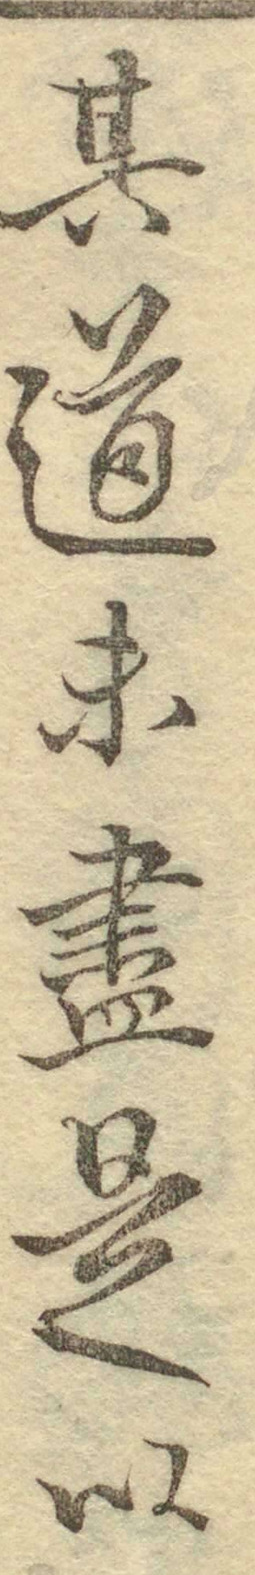其道未尽是以
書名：養蠶私録
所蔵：国文学研究資料館
